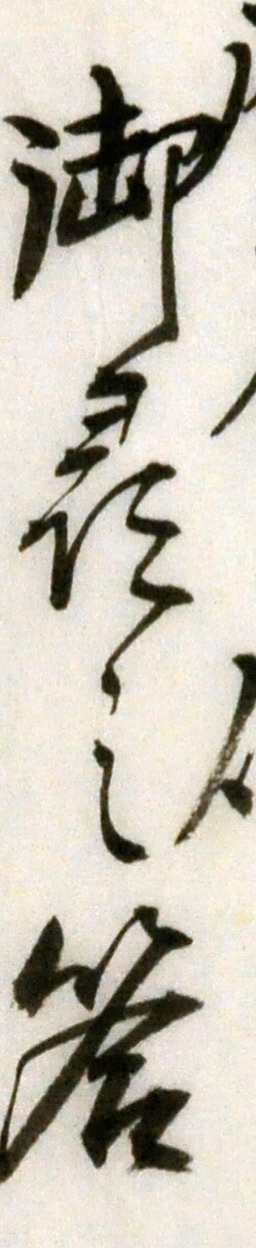御尋之答
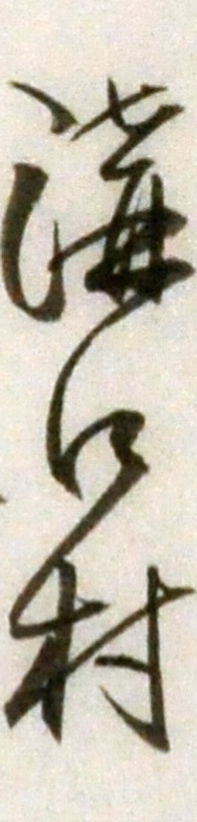溝口村
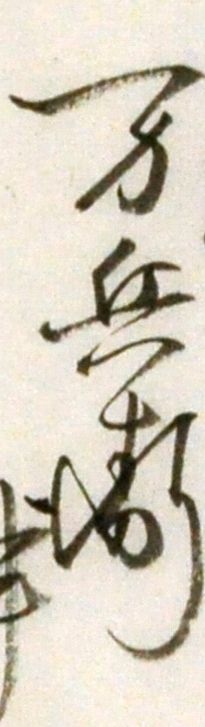万兵衛

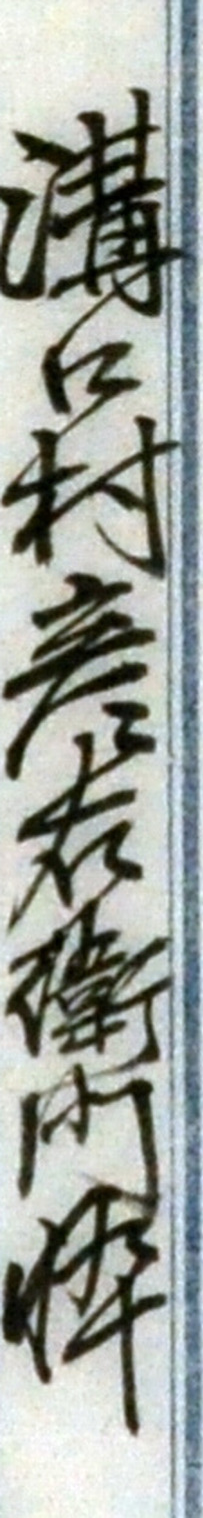溝口村彦右衛門悴
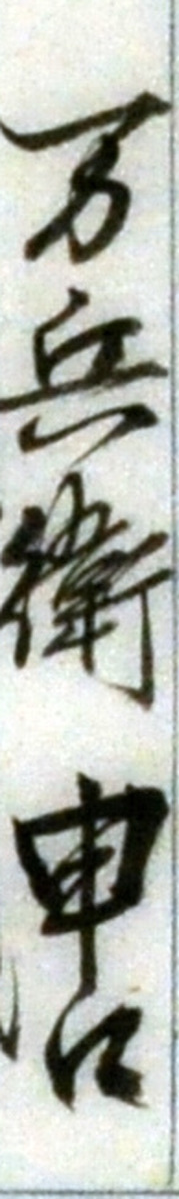万兵衛申口
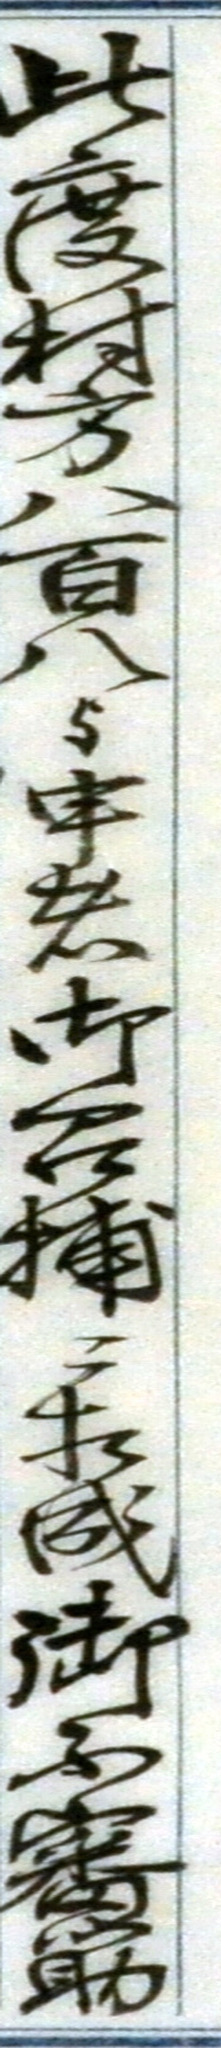此度村方八百八と申者御召捕に相成御不審筋
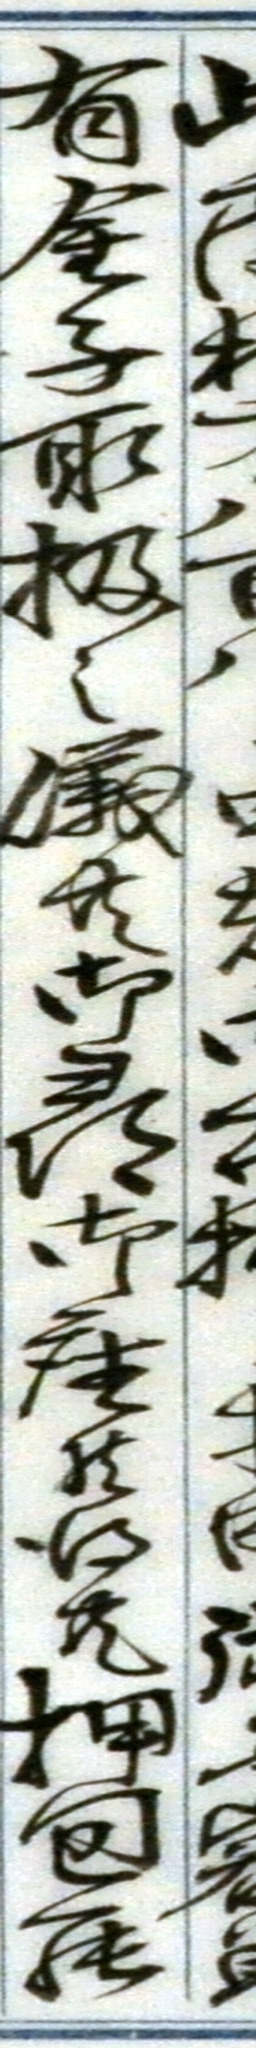有金子取扱之儀共御尋御座候得共押包罷
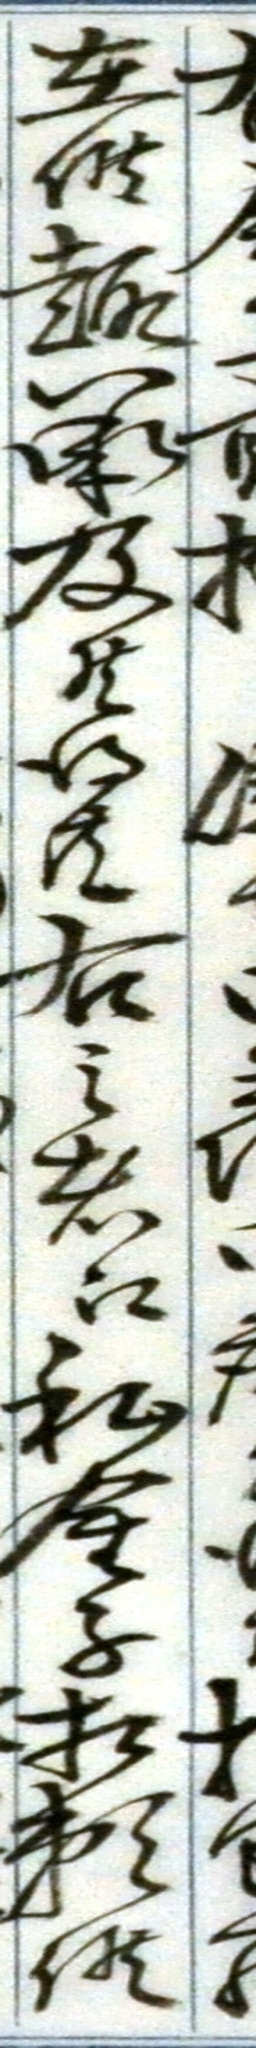在候趣承及候得共右之者え私金子相頼候
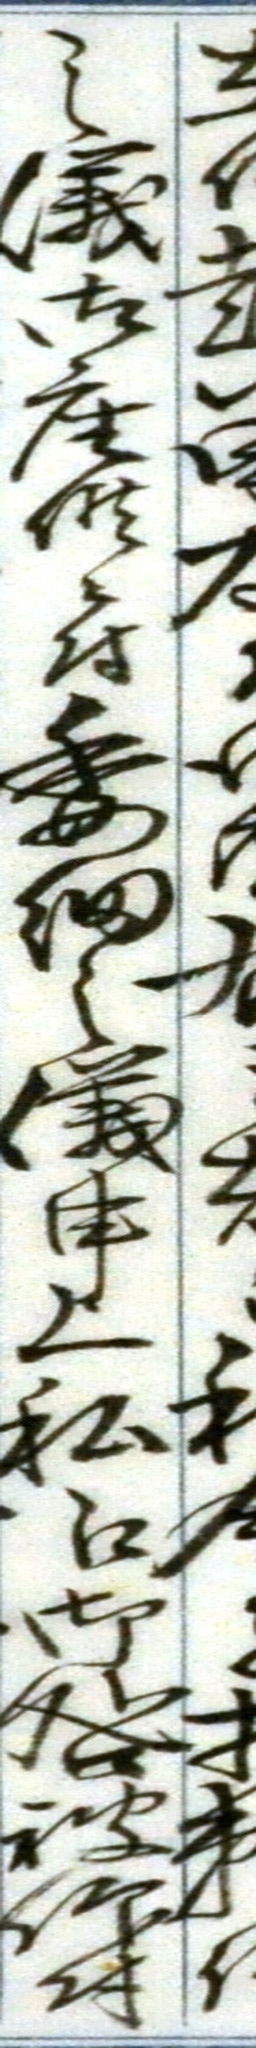之儀御座候に付委細之儀申上私え御咎被仰付
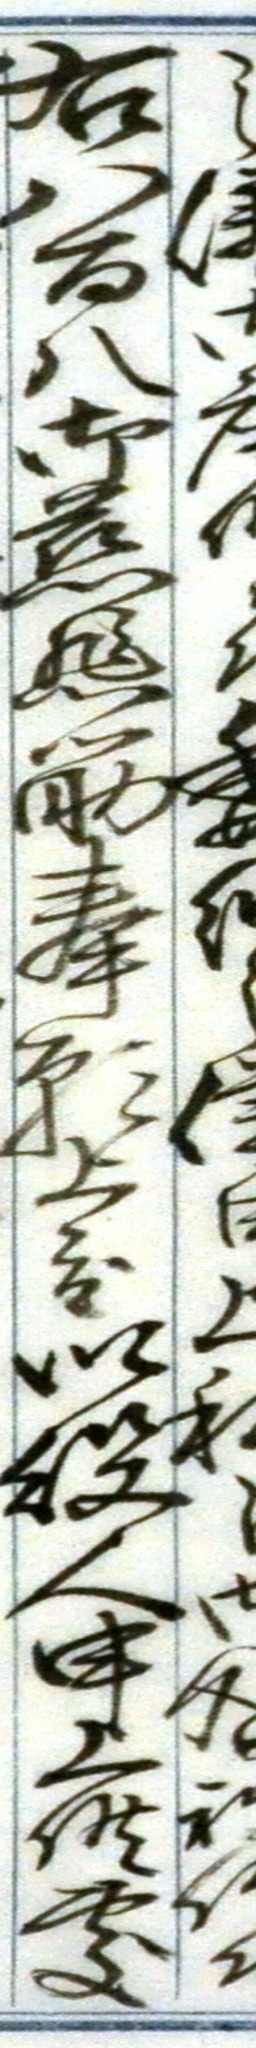右八百八御慈悲筋奉願上度以役人申上候処
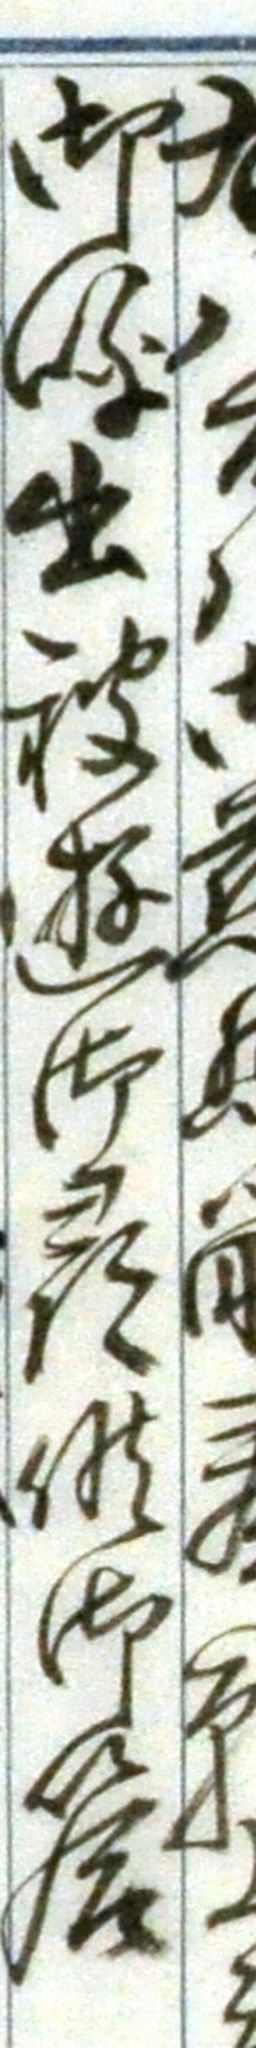御呼出被遊御尋候御答
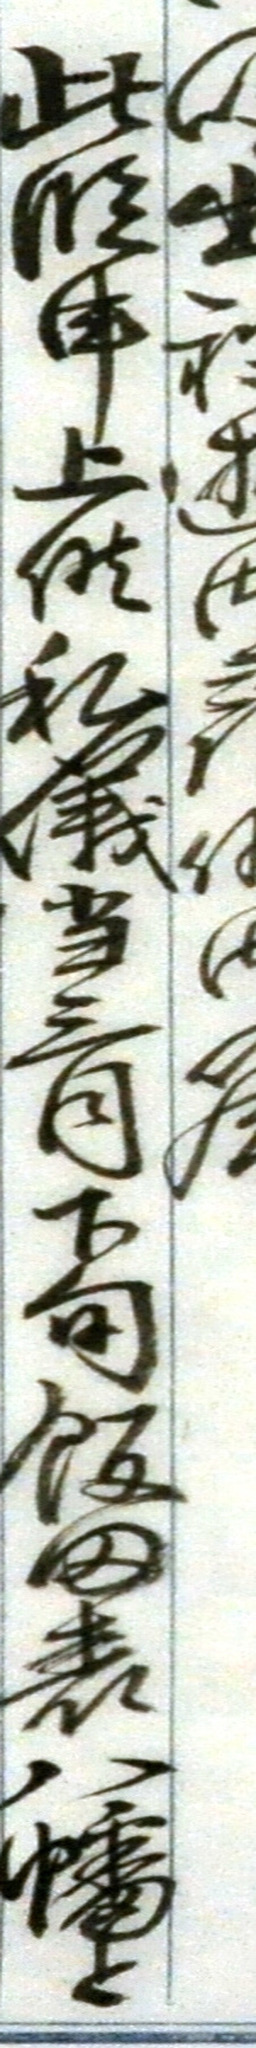此段申上候私儀当三月下旬飯田表八幡と
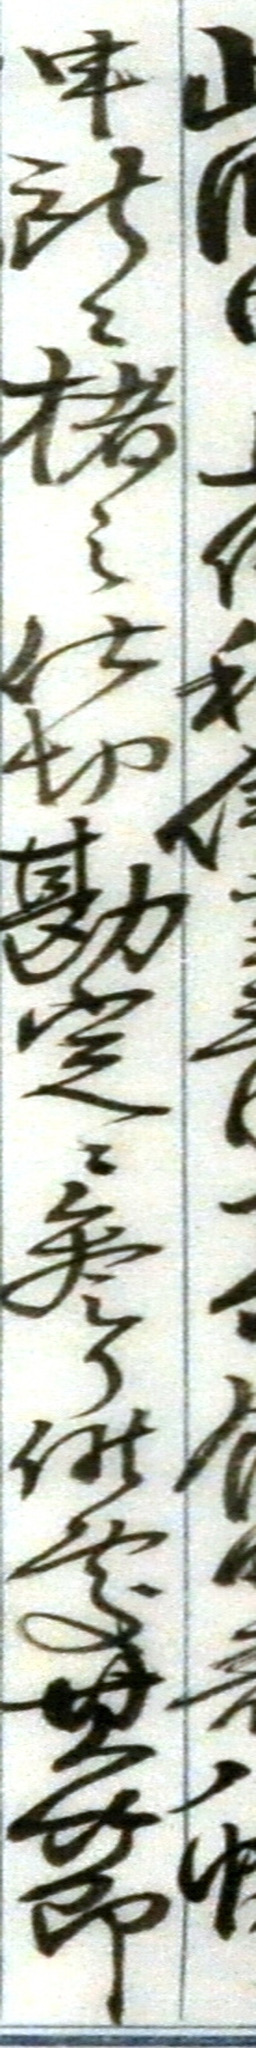申所に楮之仕切勘定に参り候処其節
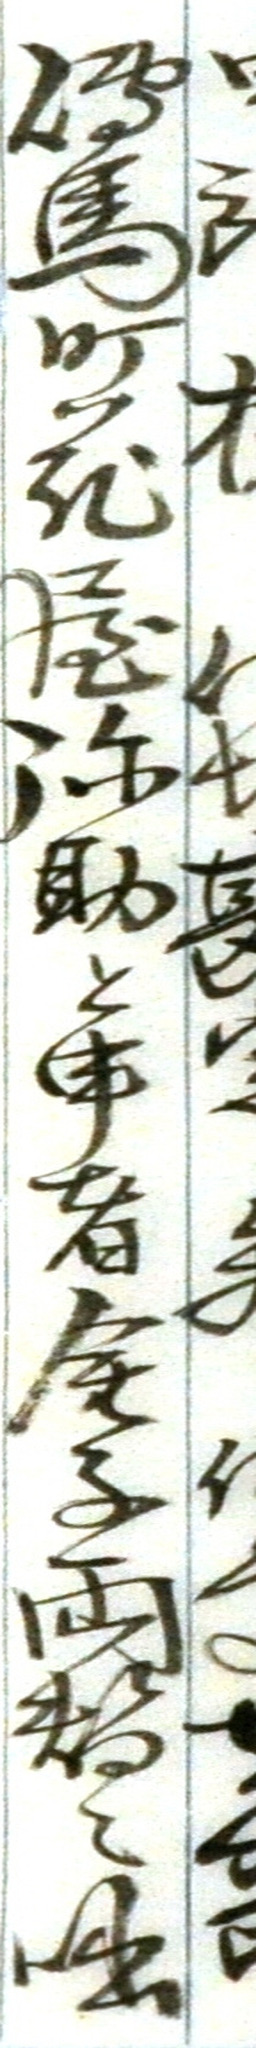伝馬町花屋弥助とも申者金子両替之咄

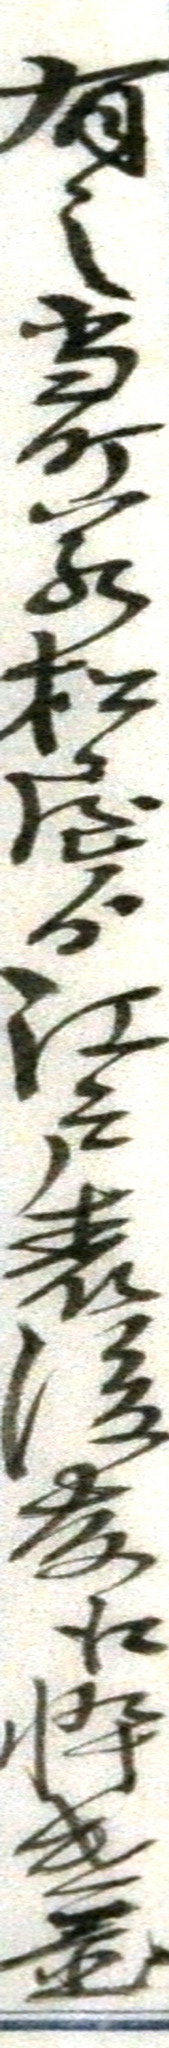有之当町蔵松屋拠りゟ江戸表後藤え悴遣置
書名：贋金之儀ニ付御尋之答
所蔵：伊那市立高遠町図書館・合同会社AMANE
